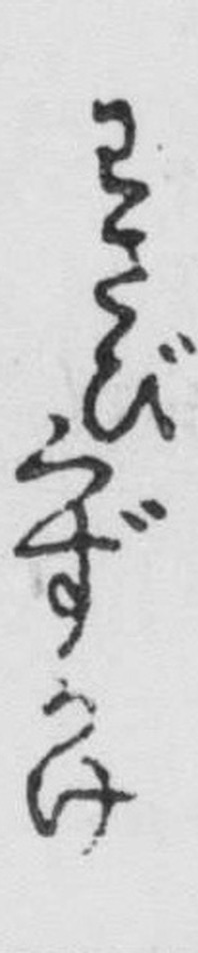わさびくずかけ
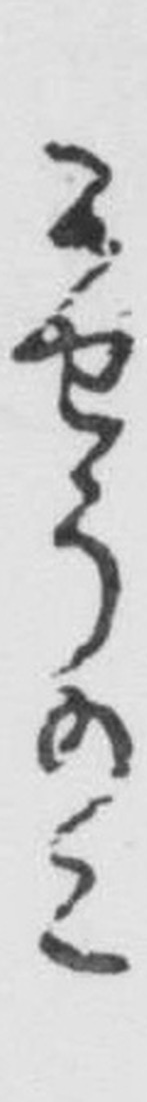こせうのみ
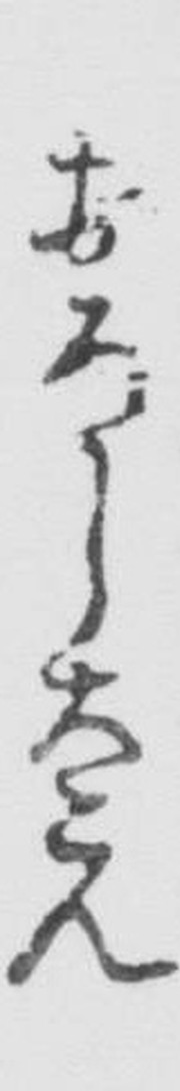おろし大こん
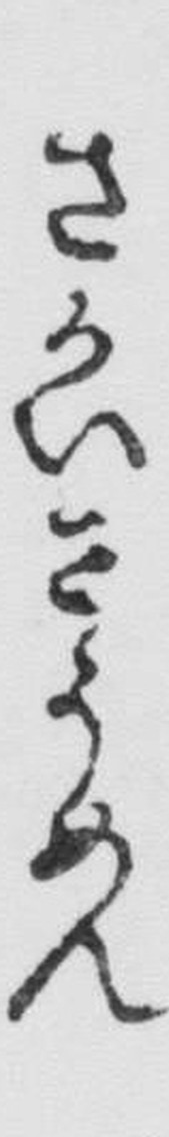さかいさうめん
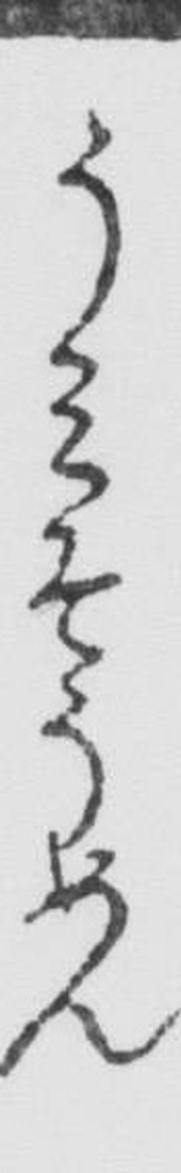うみそうめん
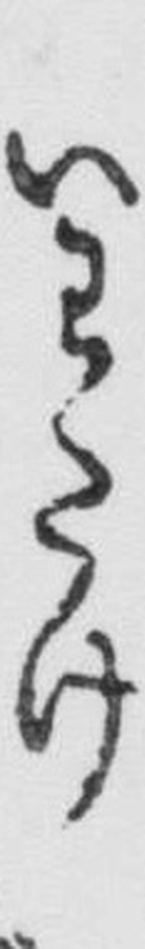いわたけ
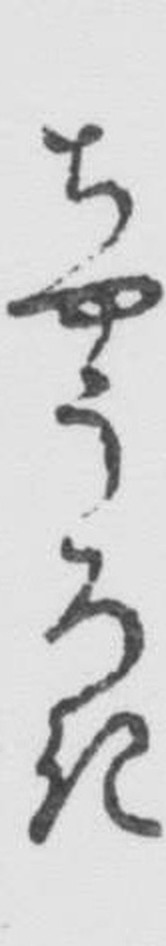ちやうろき
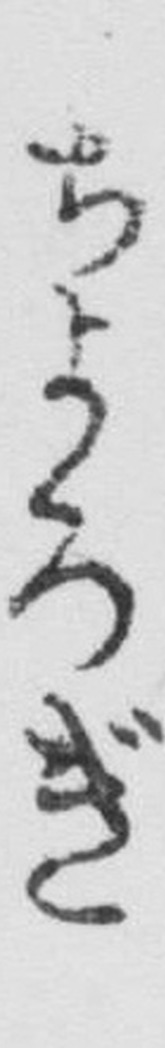ちよろぎ
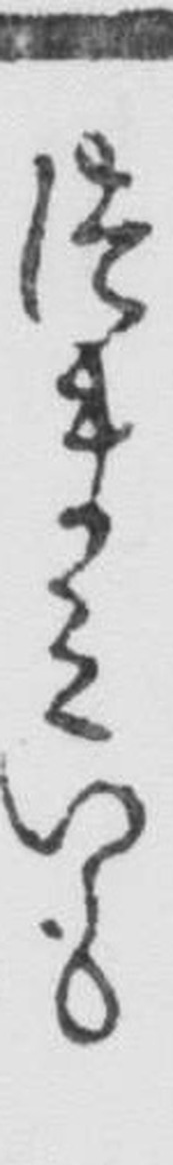つまみいも
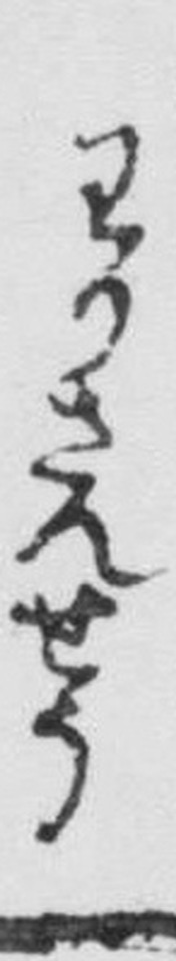わりさんせう
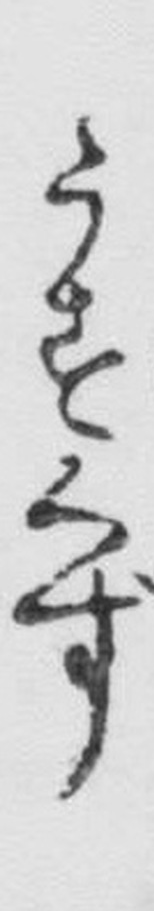うすくず
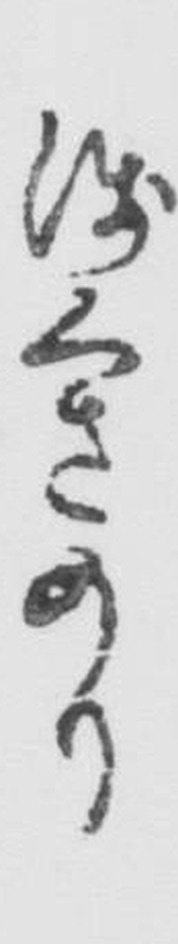浅くさのり
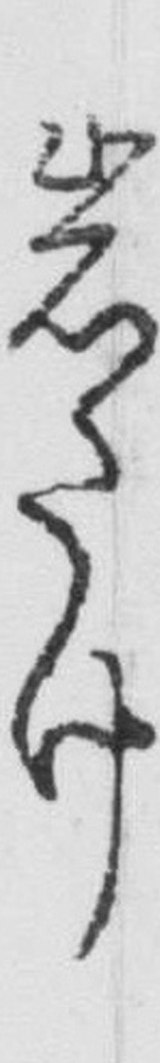岩たけ
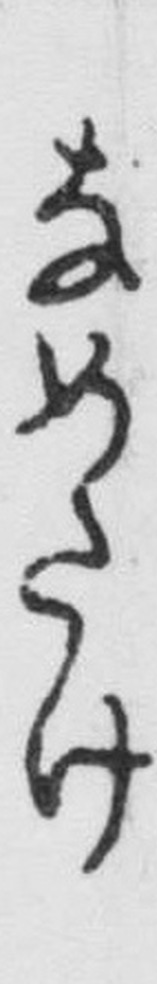なめたけ
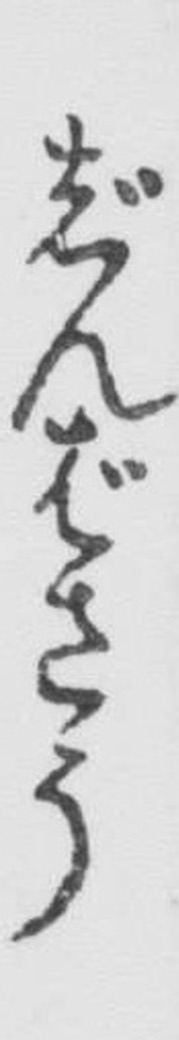じんばさう
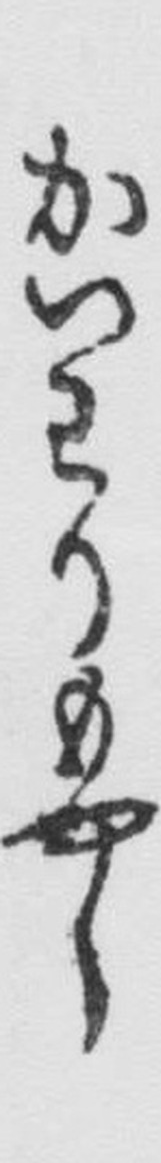かいわりもやし
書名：諸家通用/即席料理
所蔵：大阪府立大学学術情報センター 国文学研究資料館
